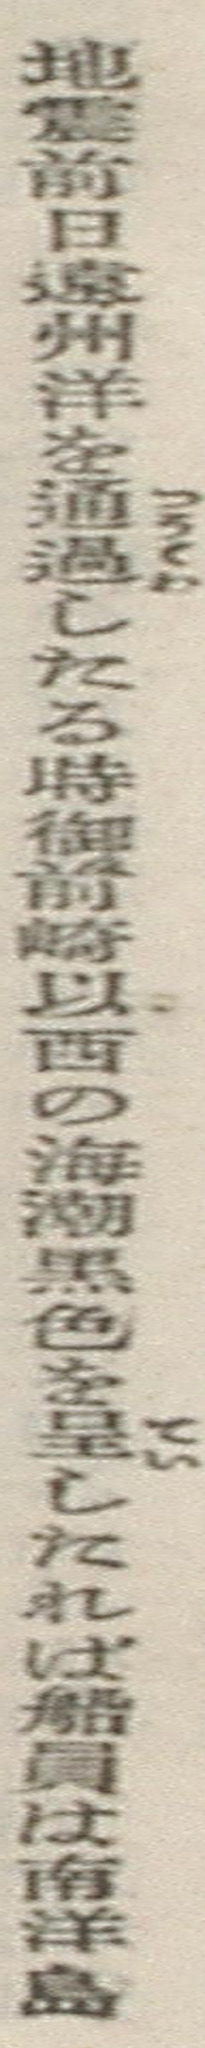地震前日遠州洋を通過したる時御前崎以西の海潮黒色を呈したれば船員は南洋島
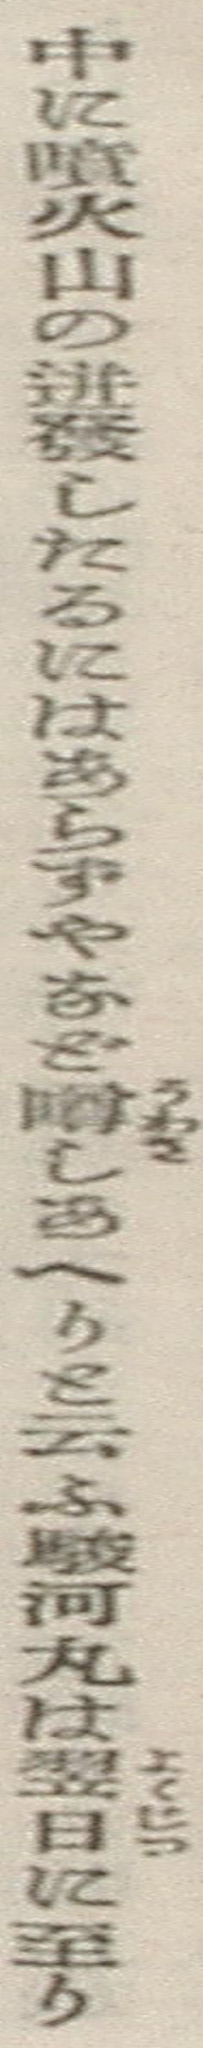中に噴火山の迸発したるにあらずやなど噂しあへりと云ふ駿河丸は翌日に至り
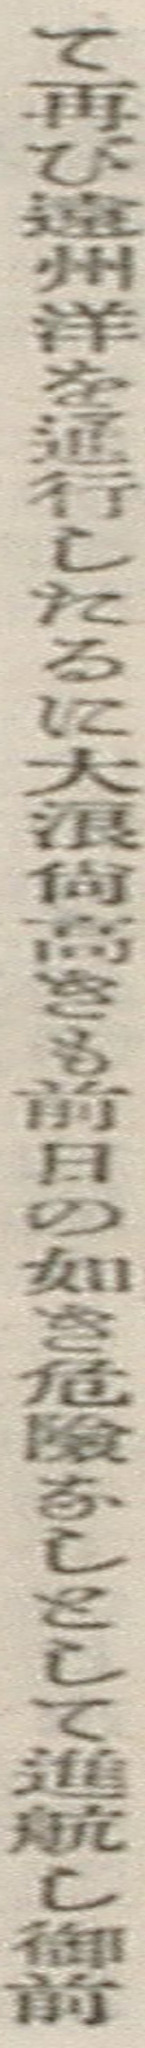て再び遠州洋を通行したるに大浪尚高きも前日の如き危険なしとして進航し御前
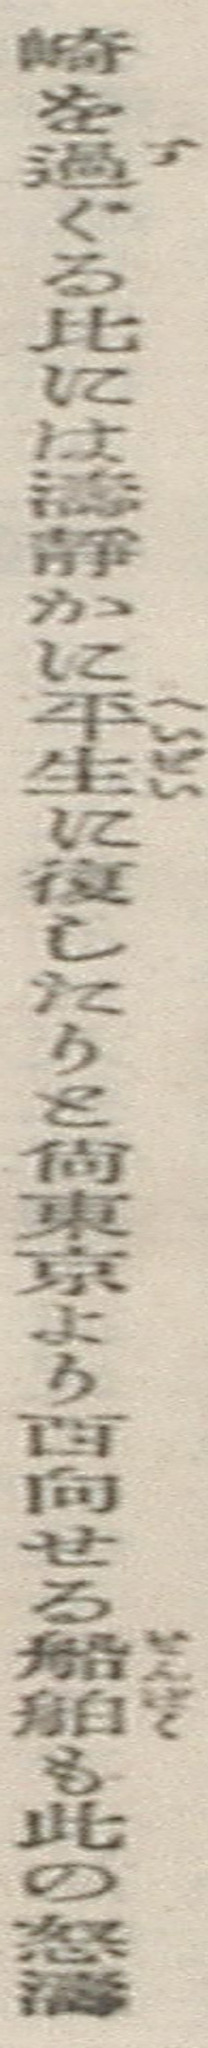崎を過ぐる比には涛静かに平生に復したりと尚東京より西向せる船舶も此怒涛
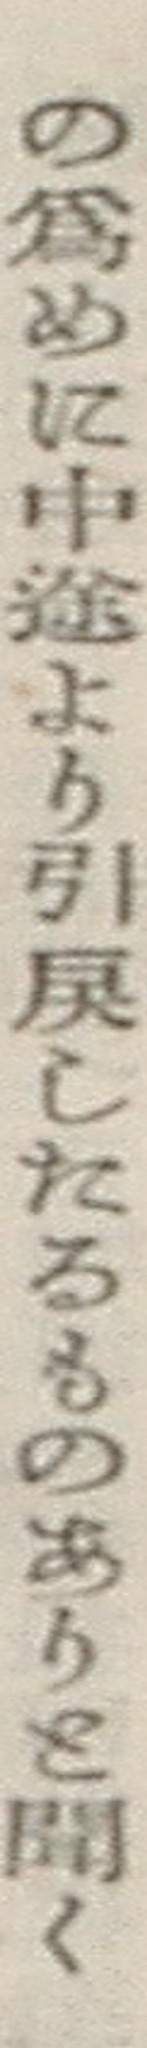の為めに中途より引戻したるものありと聞く
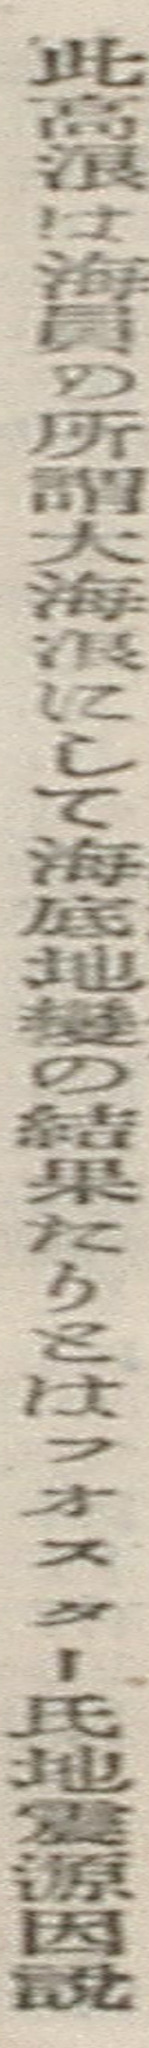此高浪は海員の所謂大海浪にして海底地変の結果たりとはフオスター氏地震源因説
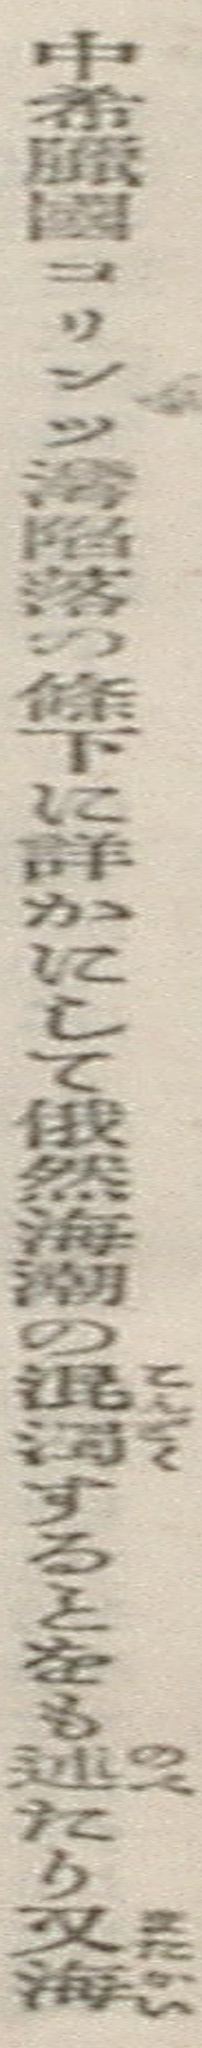中希蝋国コリンツ湾陥落の條下に詳かにして俄然海潮の混濁することをも述べたり又海
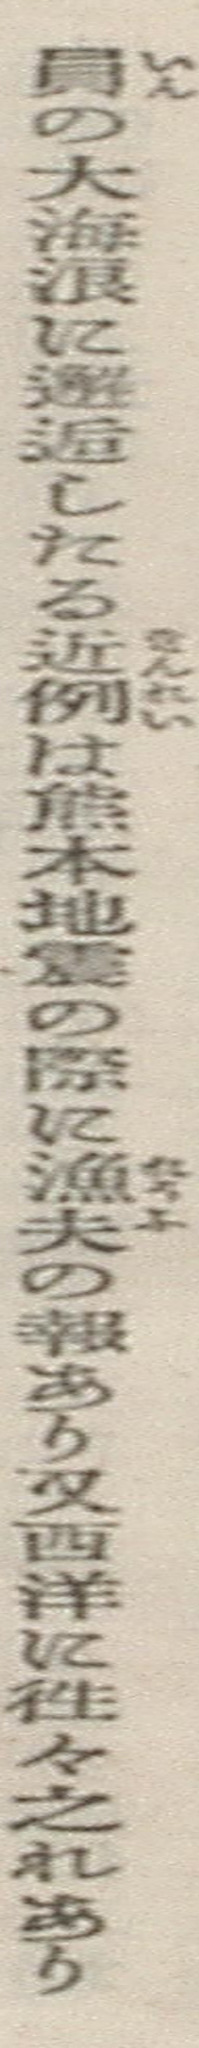員の大海浪に邂逅したる近例は熊本地震の際に漁夫の報あり又西洋に往々之れあり
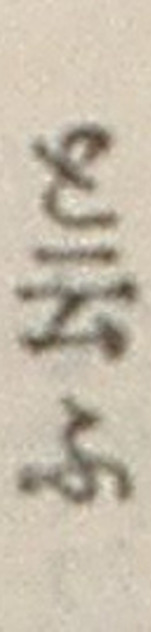と云ふ
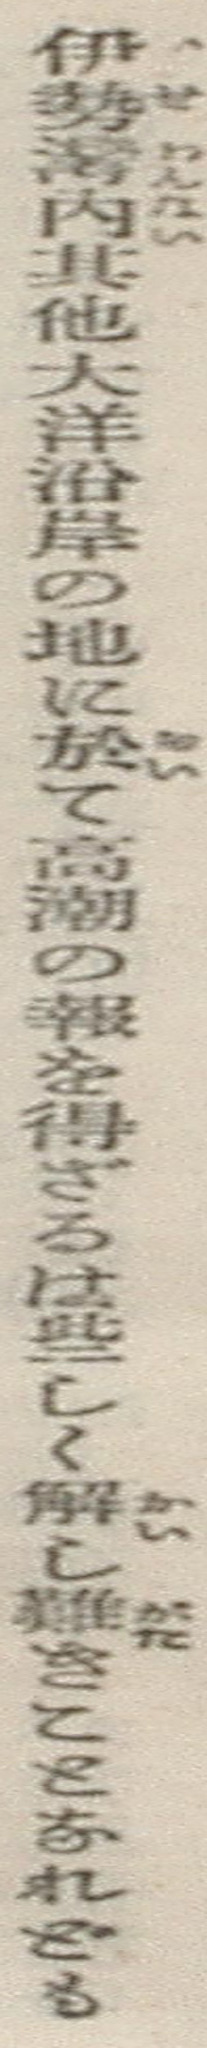伊勢湾内其他大洋沿岸の地に於て高潮の報を得ざるは些しく解し難きことなれども
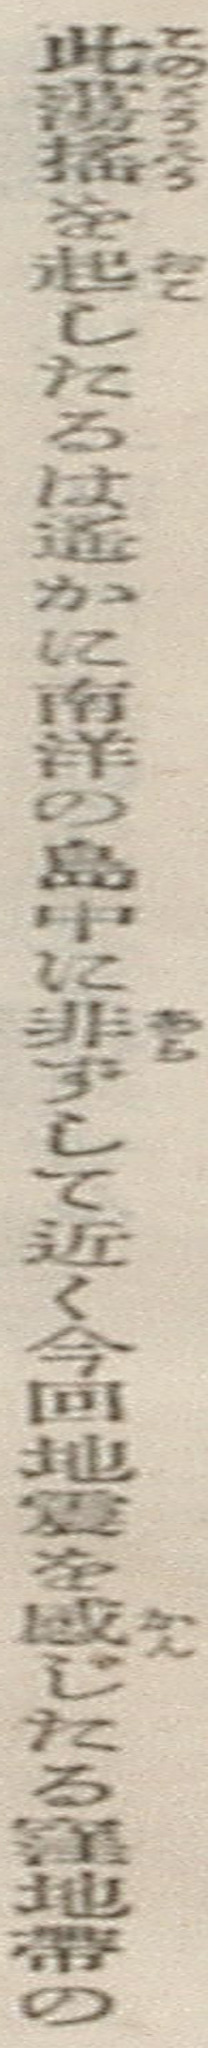此蕩揺を起したるは遥かに南洋の島中に非ずして近く今回地震を感じたる窪地帯の
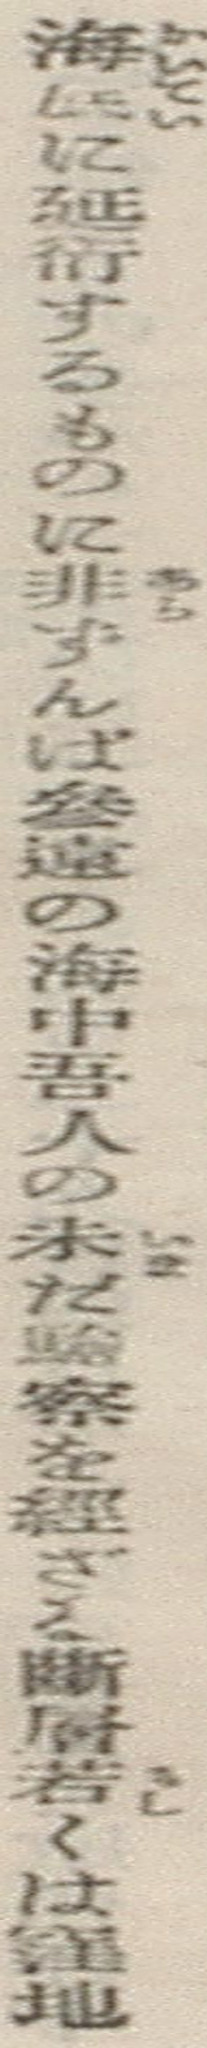海底に延衍するものに非ずんば参遠の海中吾人の未だ験察を経ざる断層若くは窪地
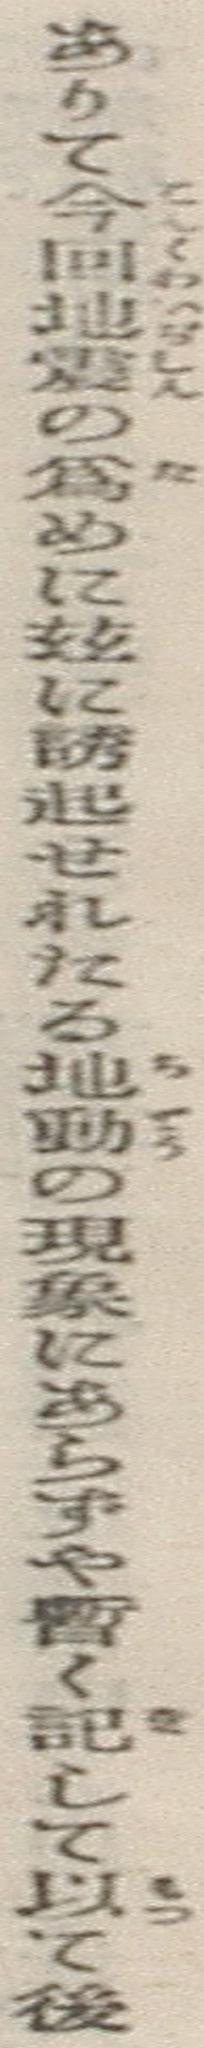ありて今回地震の為めに茲に誘起せられたる地動の現象にあらずや暫く記して以て後
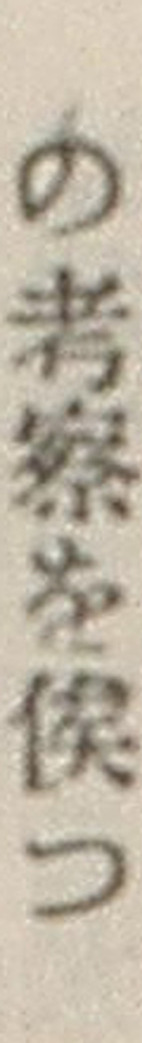の考察を俟つ
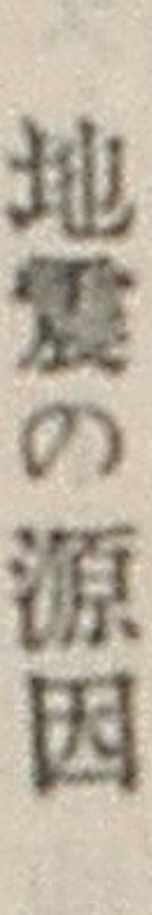地震の原因
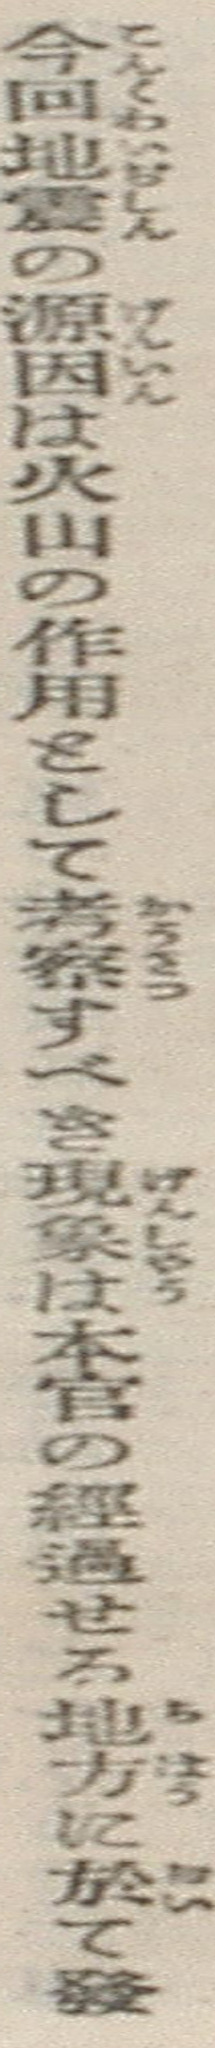今回地震の源因は火山の作用として考察すべき現象は本官の経過せる地方に於て発
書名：愛知岐阜福井三県　大地震見聞録（内題）
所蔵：東京大学地震研究所図書室 Earthquake Research Institute Library, The University of Tokyo, JAPAN
